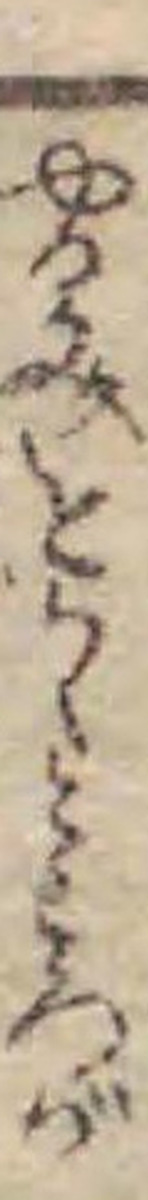やる文をかくところが
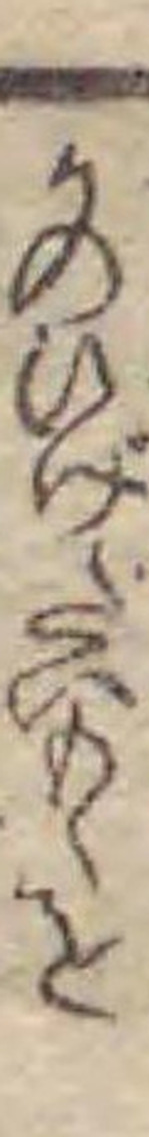かのひげだいもくを
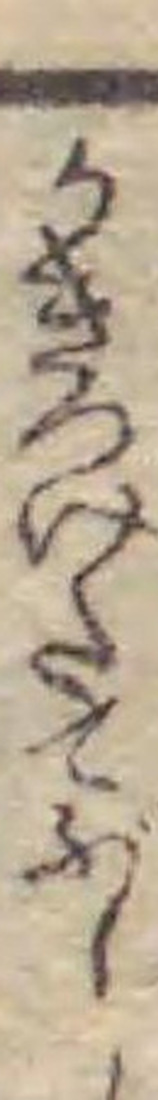かきつけたてぶし
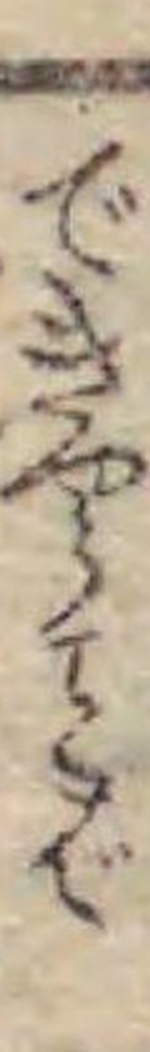できやうことば
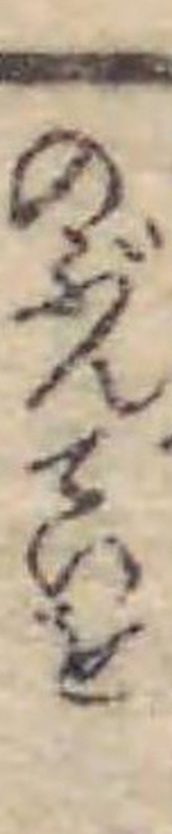のぶんていを
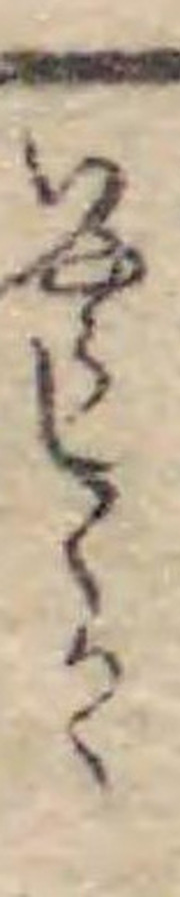いやらしくかく
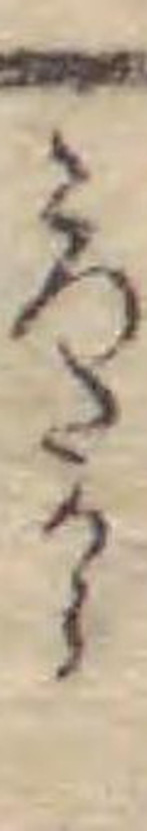こつたから
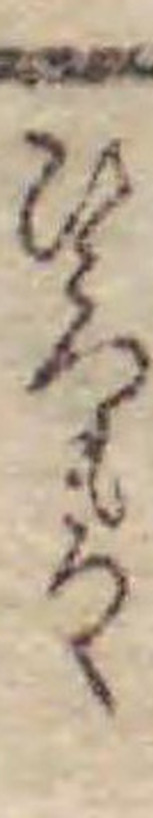ひとつもろく
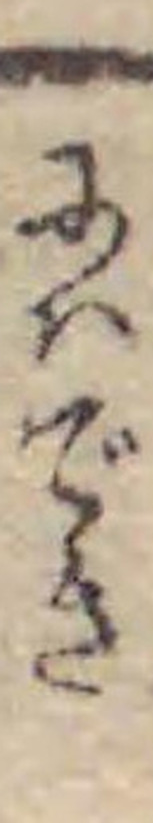にはでき
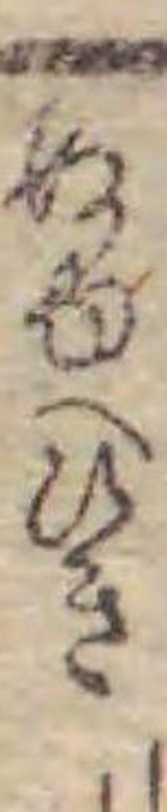ぬゆへひき
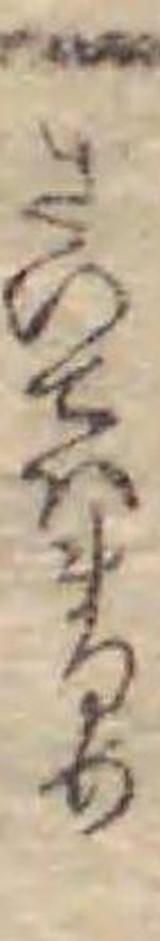さいてはまるめ
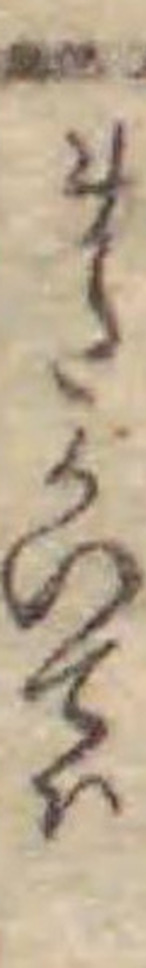またかいては
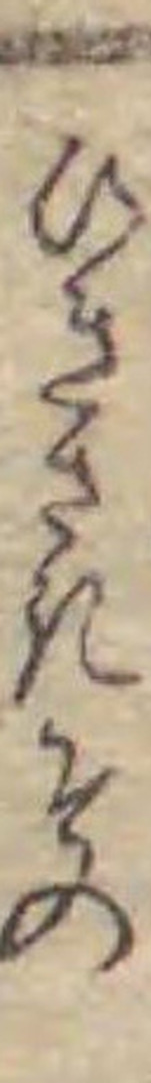ひきさきその
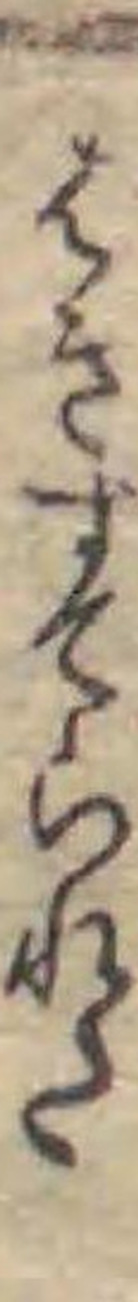はきすてられた
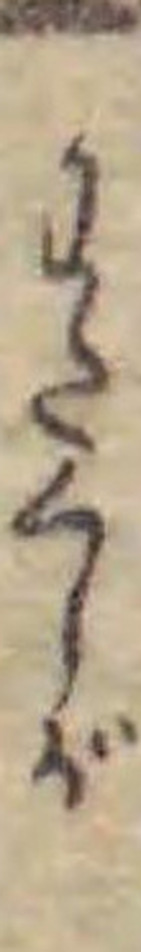わたくしが
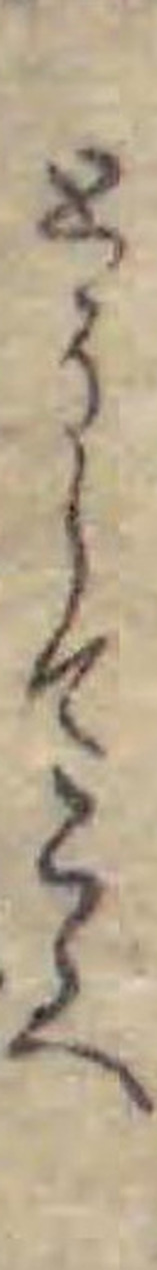こうしてこゝへ
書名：紙屑身上噺 : 3巻
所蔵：国立国会図書館 National Diet Library, JAPAN
